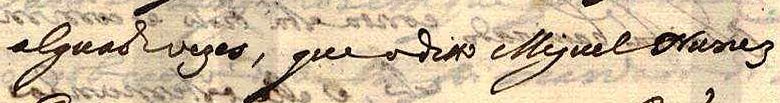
alguas̄ vezes, que o ditto Miguel Nunez
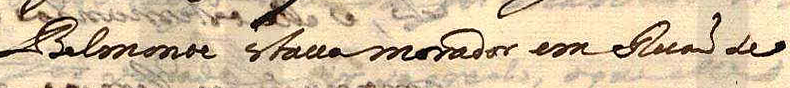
Belmonte estaua morador em Ruaõ de
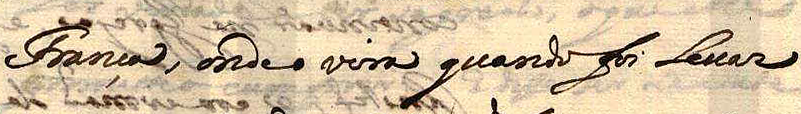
França, onde o vira quando foi leuar
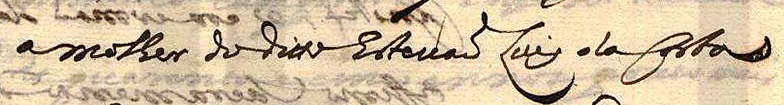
a molher do ditto Esteuaõ Luis da Costa
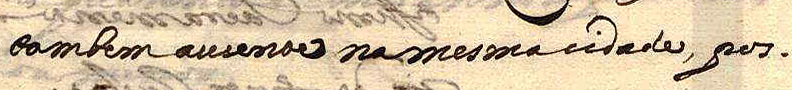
tambem ausente na mesma cidade, pos
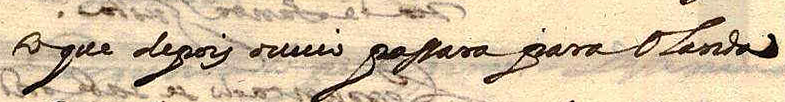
to que depois ouuio passara para Olanda
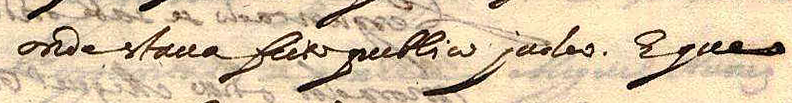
onde estaua feito publico judeo. E que
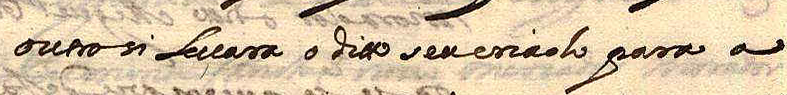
outrosi leuara o ditto seu criado para a
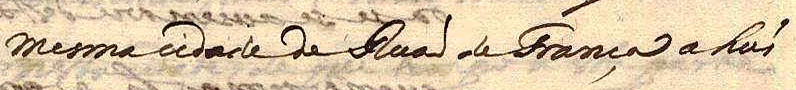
mesma cidade de Ruaõ de França a hus̄
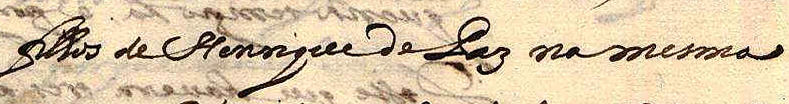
filhos de Henrique de Paz na mesma
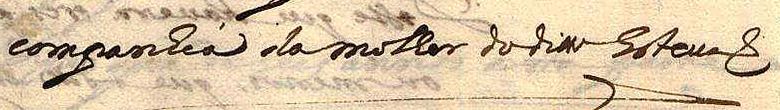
companhia da molher do ditto Estauaõ
